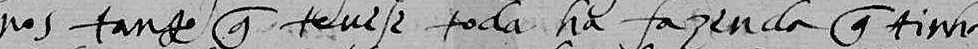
nos tanto q̄ teuese toda ha fazenda q̄ tinha
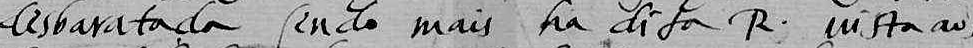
desbaratada sendo mais ha dita R. uista aos
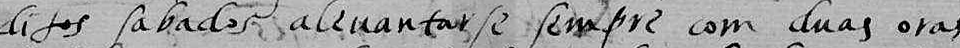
ditos sabados aleuantar se sempre com duas oras
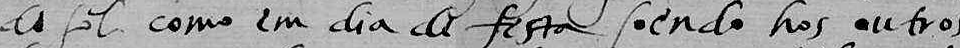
do sol como em dia de festa soendo hos outros
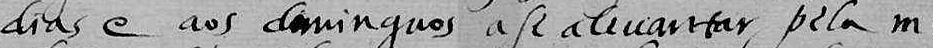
dias e aos dominguos a se aleuantar pela me
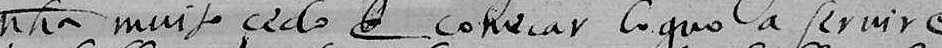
nhā muito cedo e começar loguo a seruir e
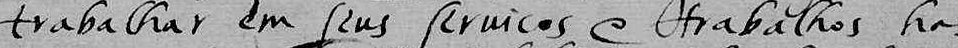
trabalhar em seus seruiços e trabalhos has
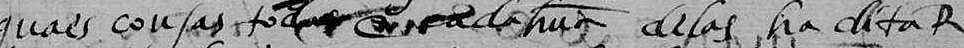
quaes cousas todas e cada hūa delas ha dita R
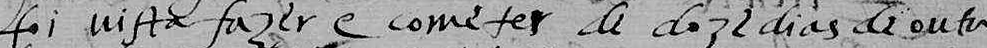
foi uista fazer e cometer de doze dias de outu
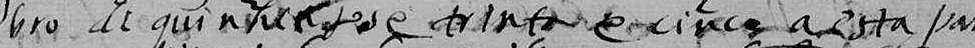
bro de quinhentos e trinta e cinco a esta par
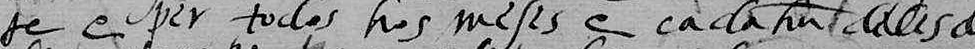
te e per todos hos meses e cada hū deles do
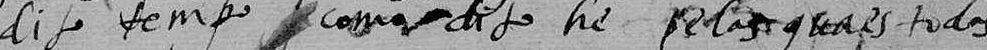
dito tempo como dito he pelas quaes todas
